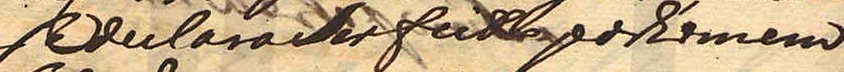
se declara ser feitto por homem
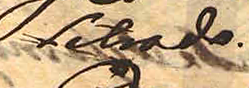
letrado.
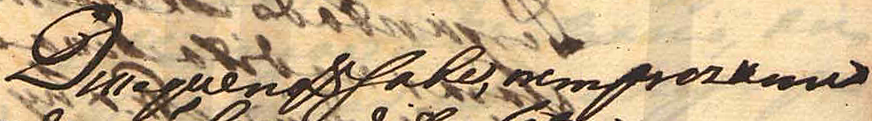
Disse que naõ sabe, nem prezume
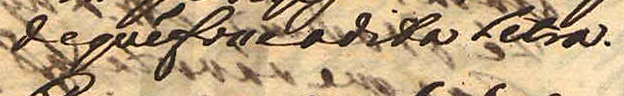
de quē fosse a dita Letra.
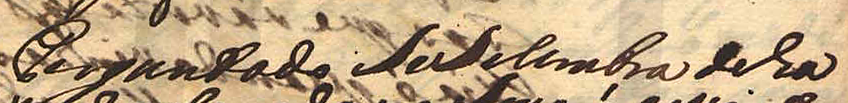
Perguntado Se Se lembra de ha
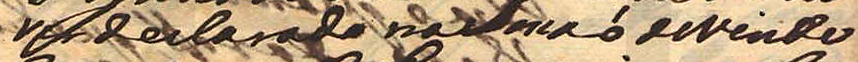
ver declarado na Sessaõ de vinte
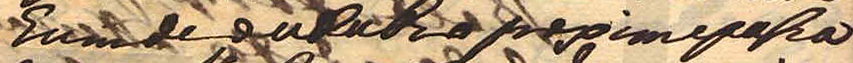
hum de outubro proxime passa
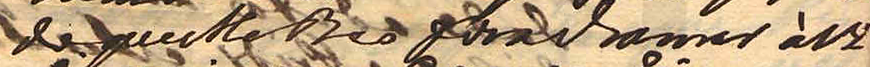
do que elle Reo fora chamar à Vi
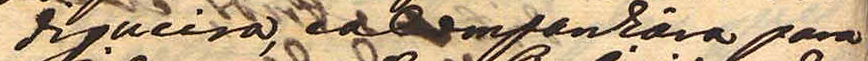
digueira, e acompanhara para
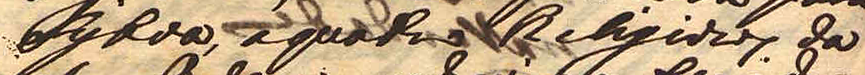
Lisboa, a quatro Religiozos da
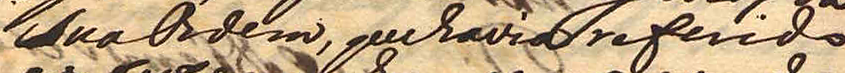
sua Ordem, que havia referido
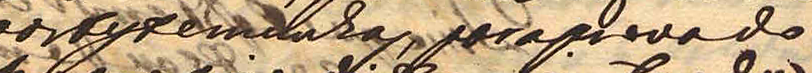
por testemunhas, para prova do
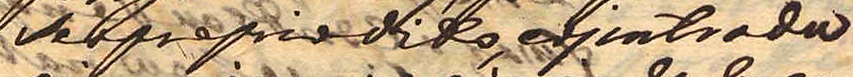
seo proprio dito, e os introdu
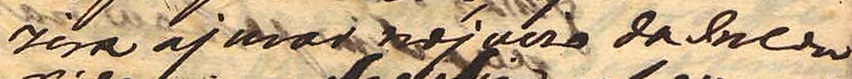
zira a jurar no juizo da Incon
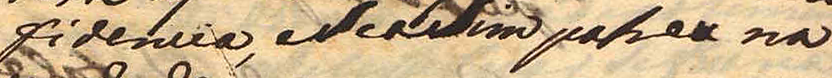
fidencia, e se asim passou na
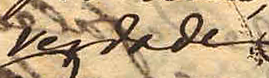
verdade
